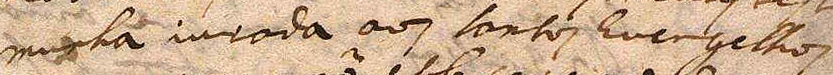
munha iurada aos santos Euangelhos
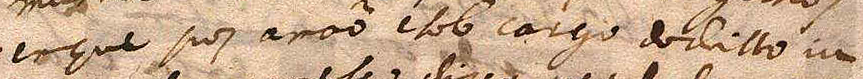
em que pos a maõ e sob cargo do ditto iu
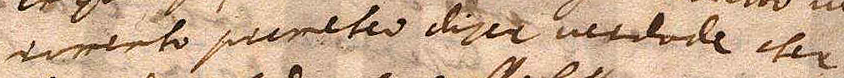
ramento prometeo dizer uerdade e ter
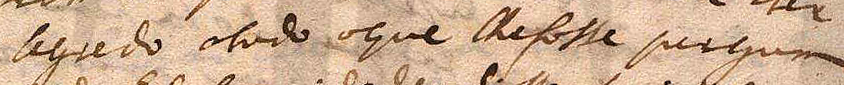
segredo a todo o que lhe fosse pergum
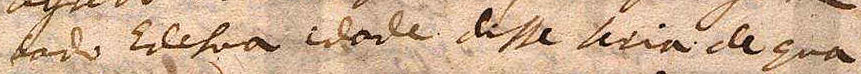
tado E de sua idade disse seria de qua
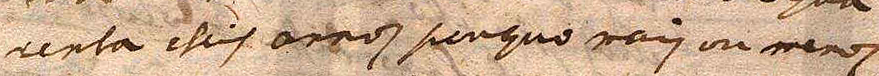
renta e seis annos pouquo mais ou menos
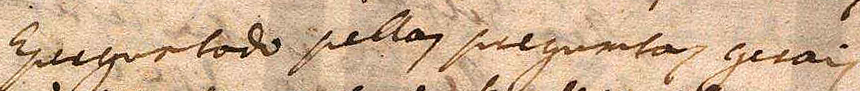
E preguntado pellas preguntas gerais
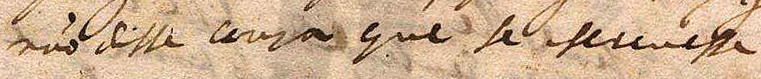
naõ disse couza que se escreuesse
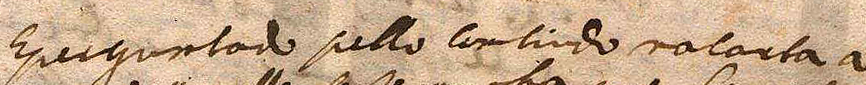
E perguntado pello contiudo na carta a
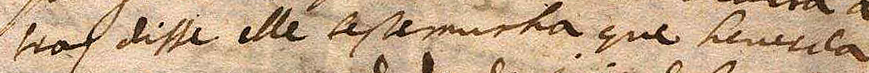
tras disse elle testemunha que he uerda
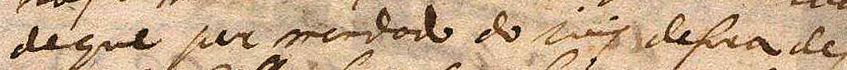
de que por mandado do iuis de fora des
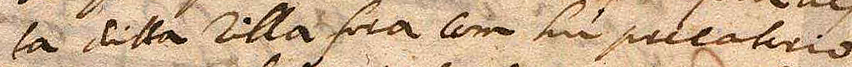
ta ditta villa fora com hū precatorio
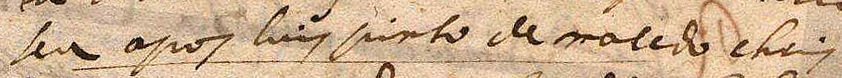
seu apos luis pinto de macedo chris
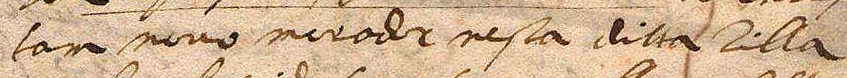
tam nouo morador nesta ditta villa
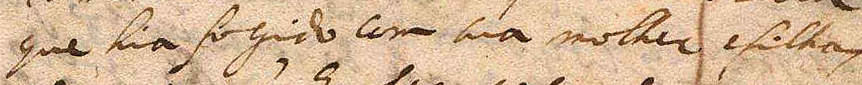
que hia fugido com sua molher e filhas
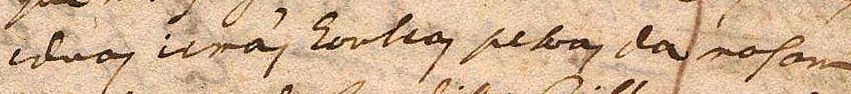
e duas irmãs E outras pesoas da nasam
